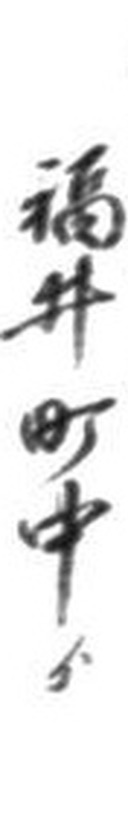福井町中ゟ

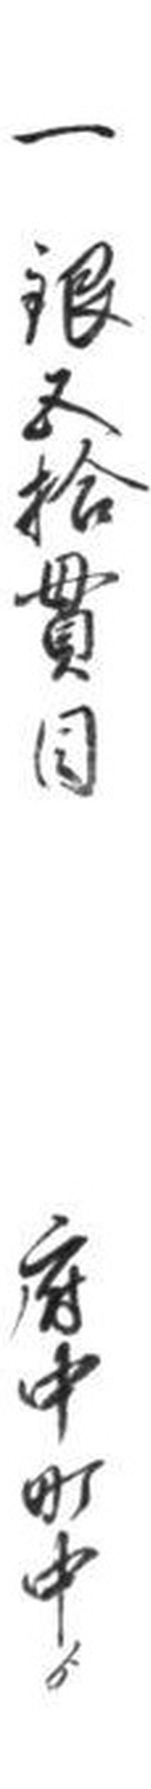一銀五拾貫目府中町内ゟ
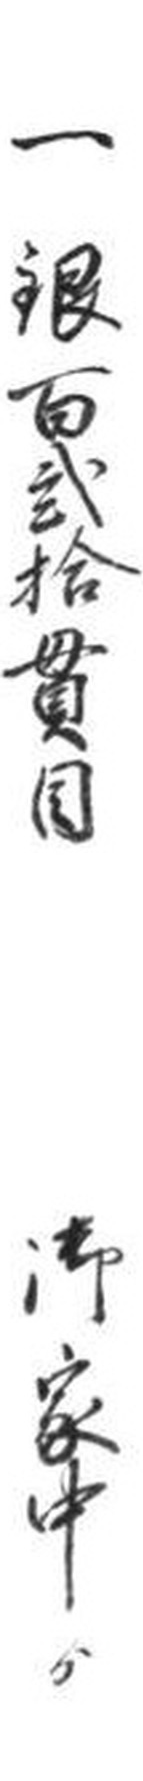一銀百二拾貫目御家中ゟ
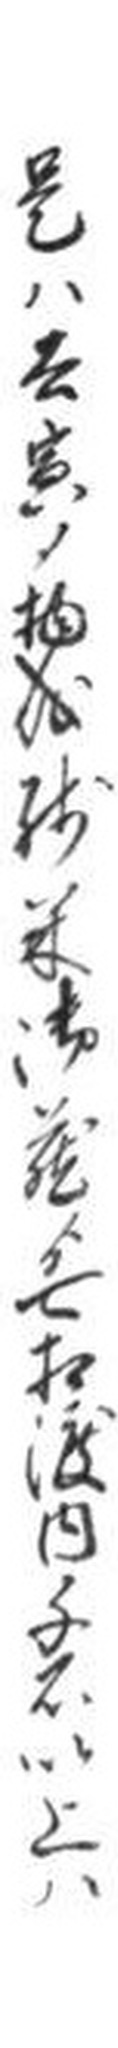是ハ去寅〆拝儀残米御蔵ゟ可相渡内千石以上ハ
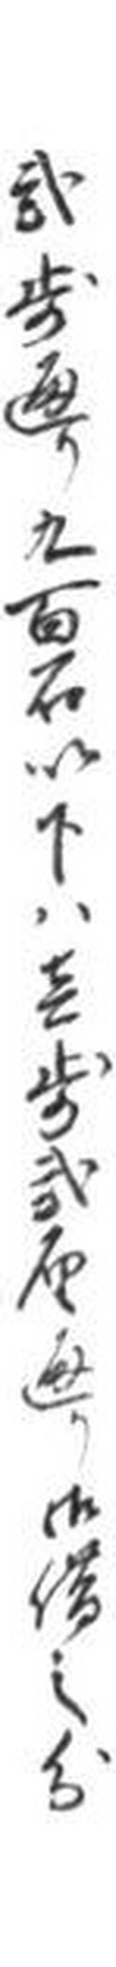弐歩返り九百石以下ハ壱歩弐厘返り御借之分
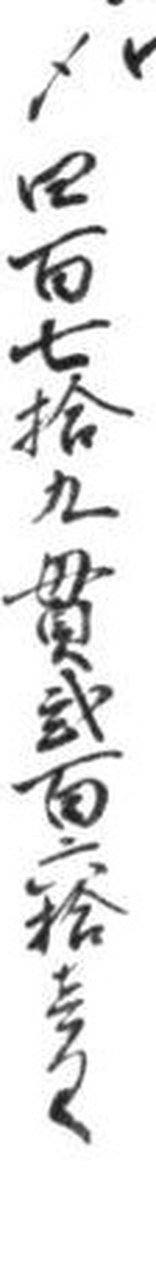〆四百七拾九貫弐百六拾壱匁
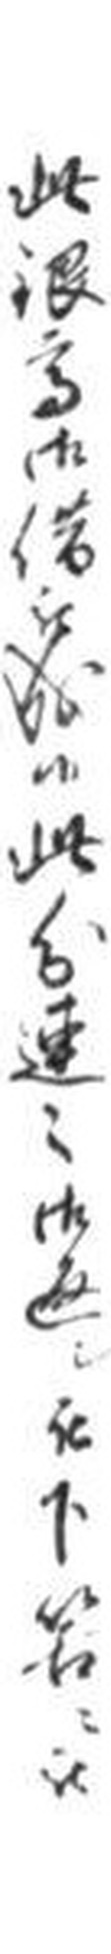此銀高御借被成候此分速々御返シ被下筈ニ被
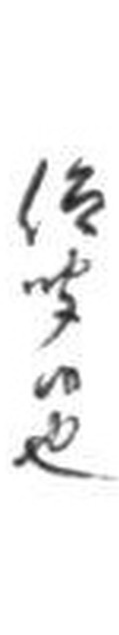仰聞候也
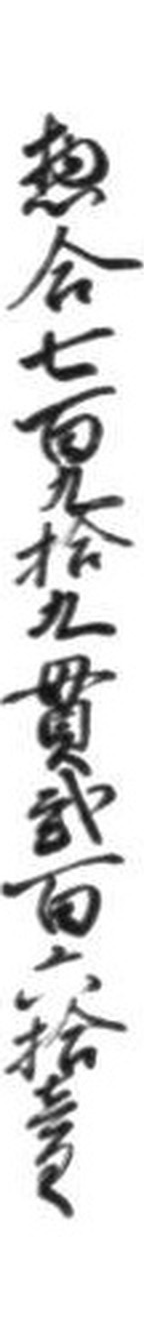惣合七百九拾九貫弐百六拾壱匁
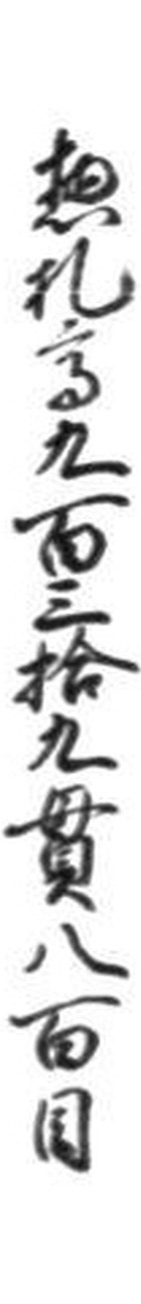惣札高九百三拾九貫八百目
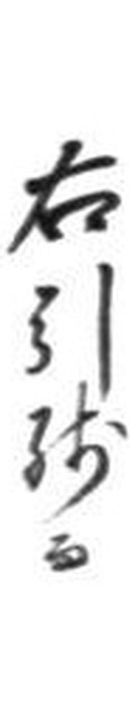右引残而
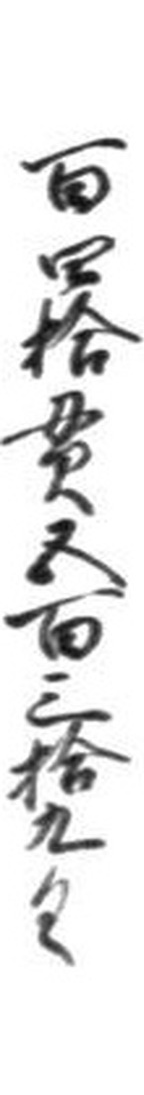百四拾貫五百三拾九匁
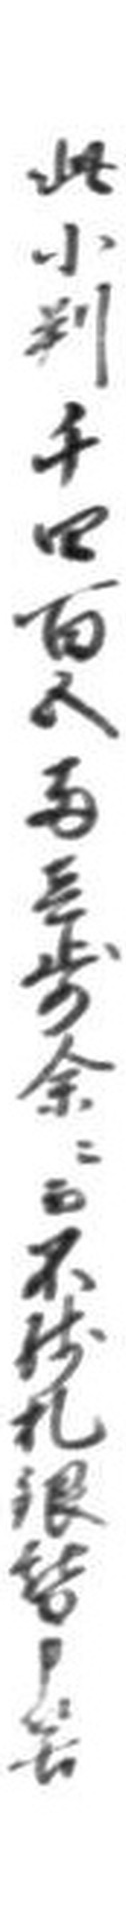此小判千四百五両壱歩余ニ而不残札銀替申筈
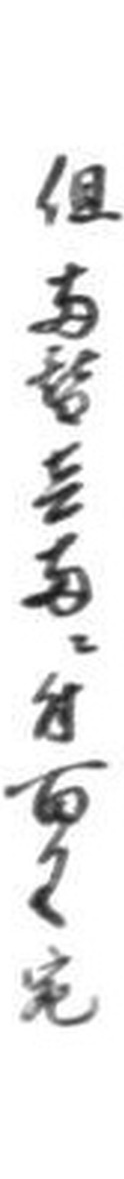但両替壱両ニ付百匁宛
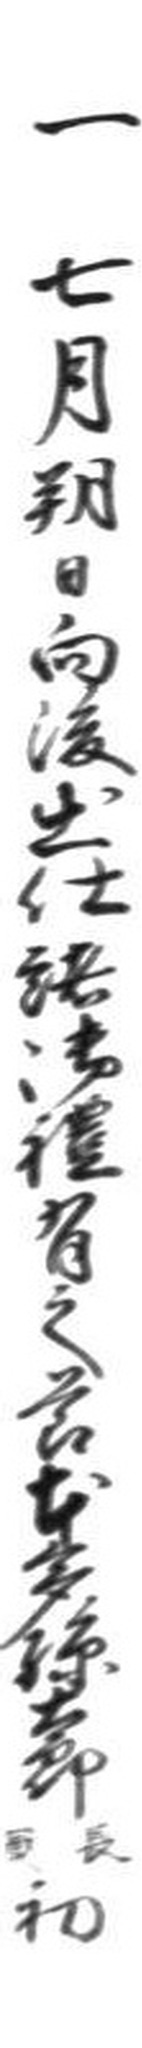一七月朔日向後出仕諸御礼有之節本多孫太郎長員初
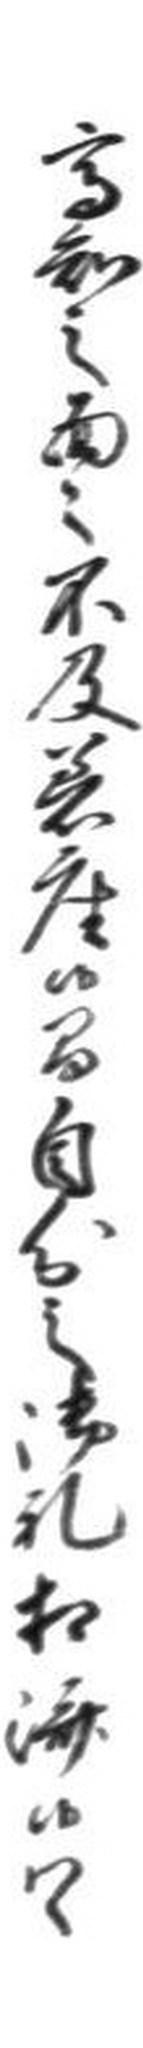高知之面々不及着座候間自分之御礼相済候ハヽ
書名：家譜 十六 吉品公 従貞享三年閏三月到同四年
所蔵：福井県文書館 Fukui Prefectural Archives
